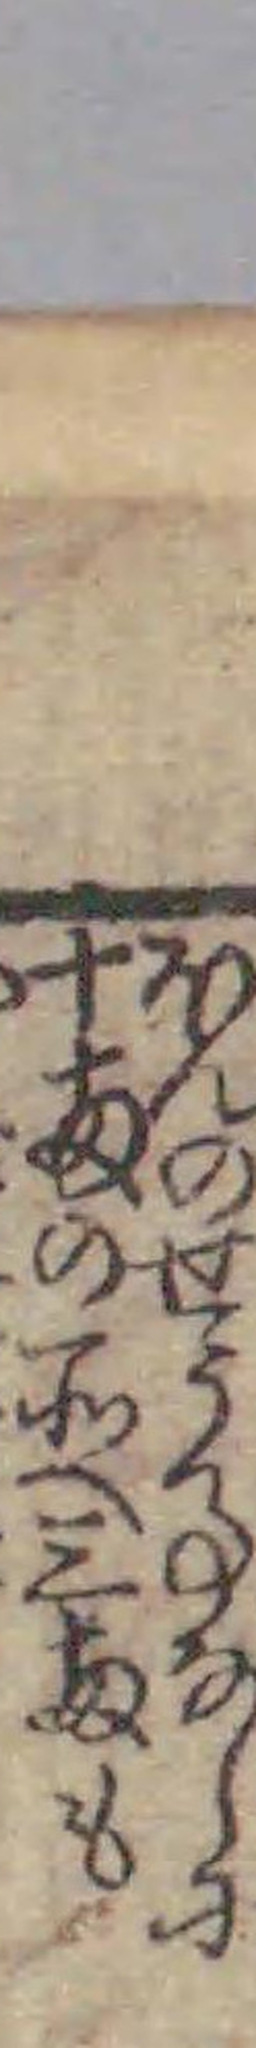十両の所へ三両も
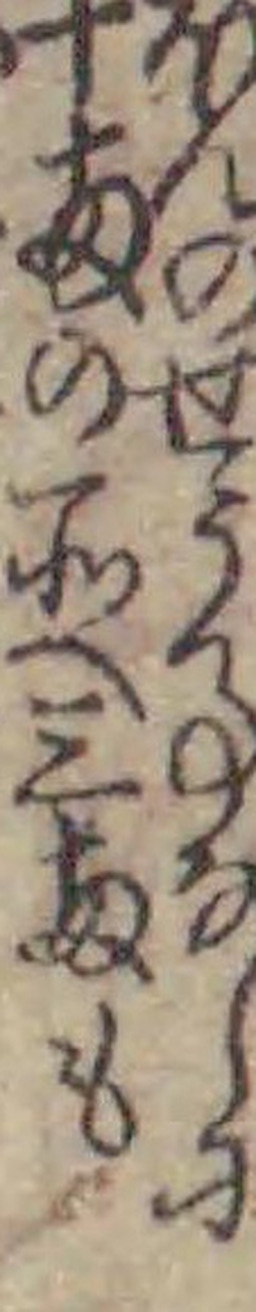十両の所へ三両も
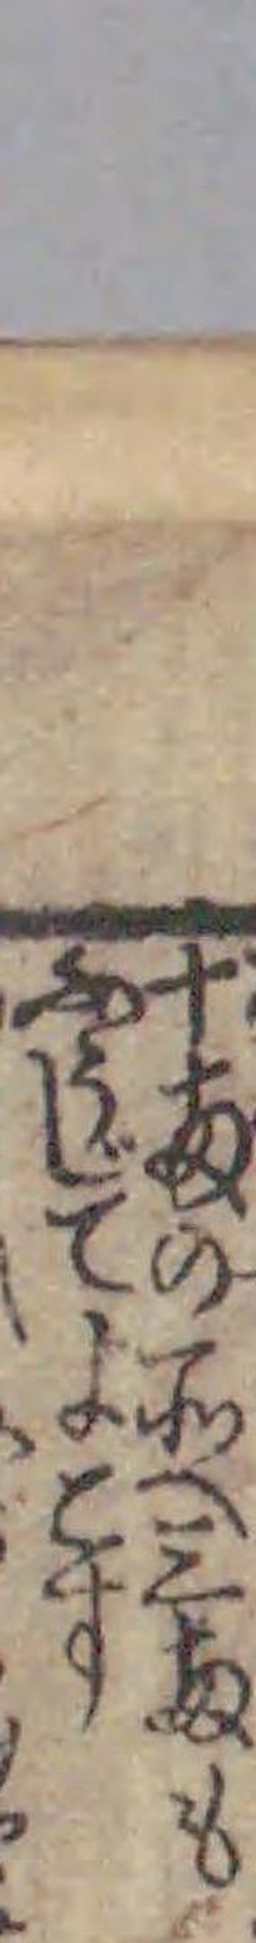ふうじてよこす
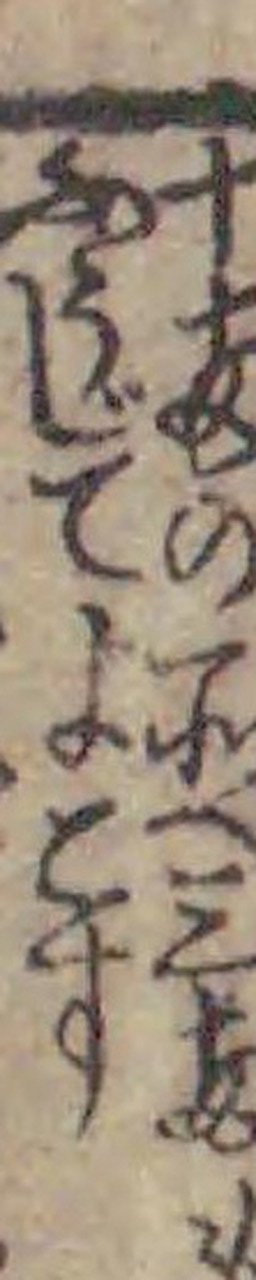ふうじてよこす
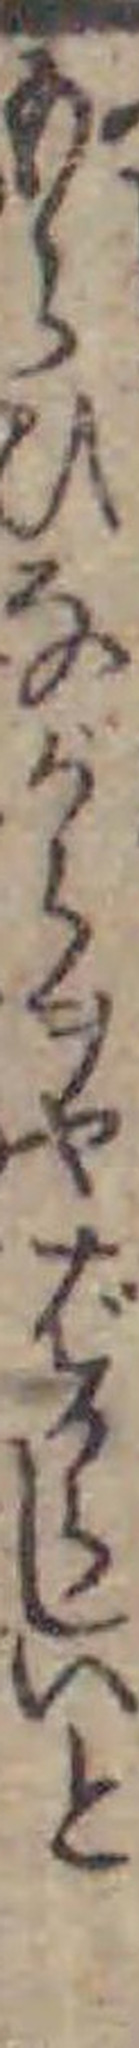もらひながらヲヤばからしいと
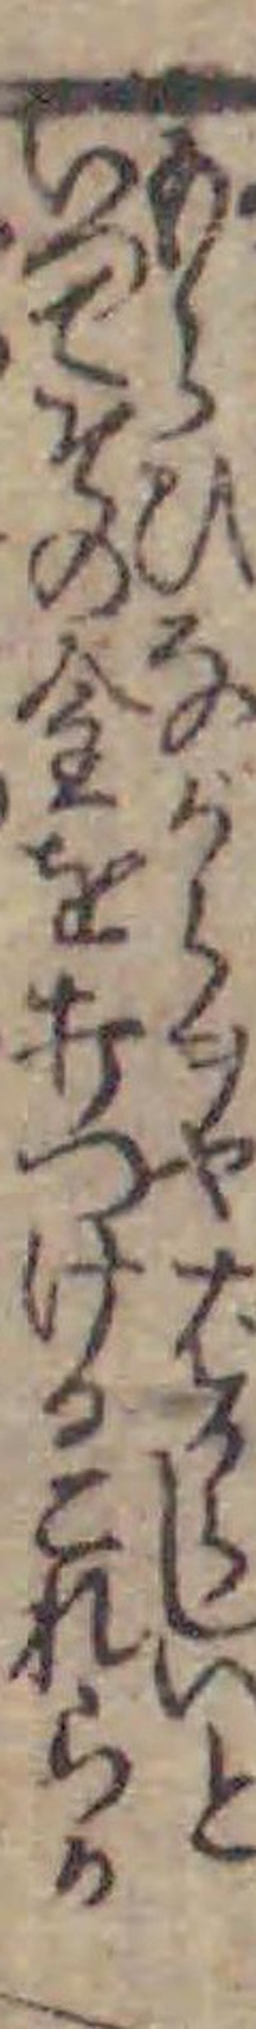いつてその金を打つけるこれらか
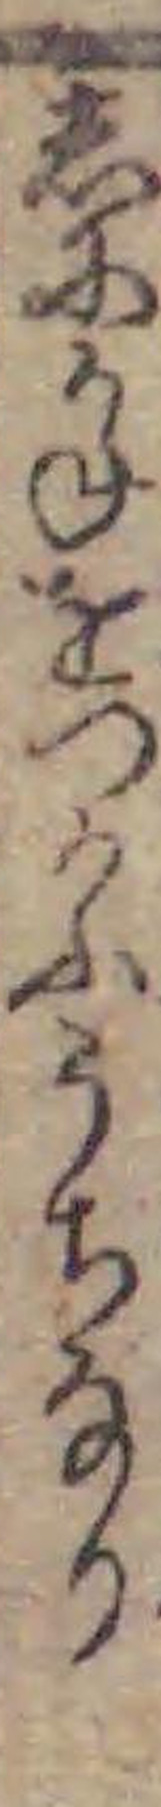しにかねをつかふうちなり

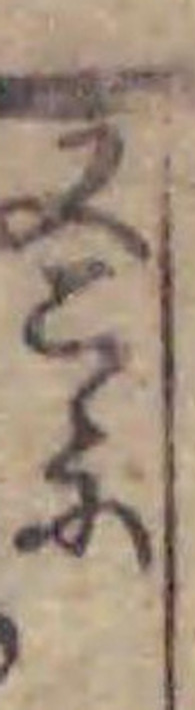又こゝに
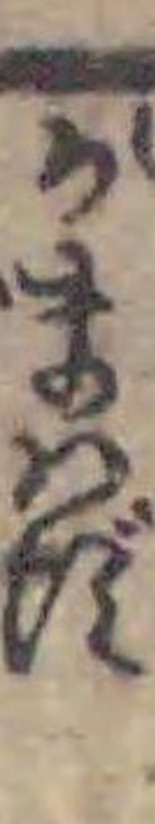かまはず
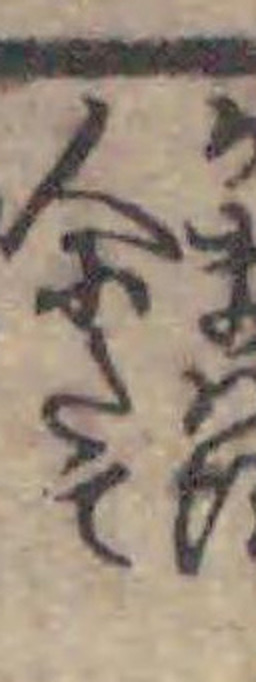人にたて
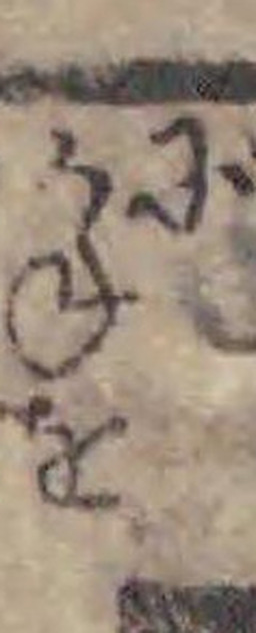かねを
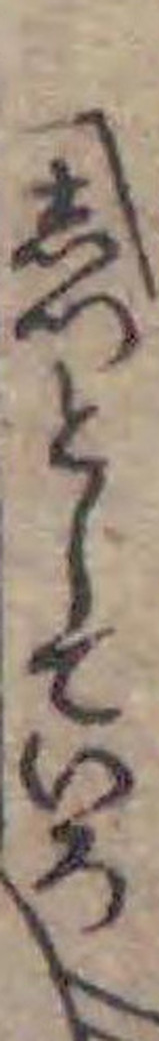〽しつとしていろ
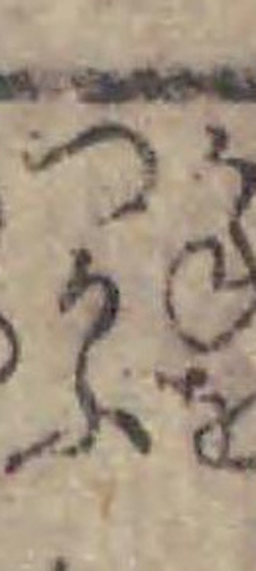つかふ
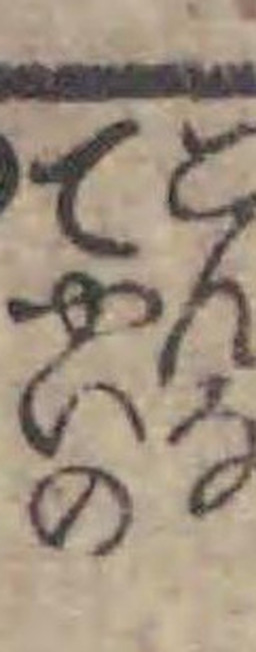てやいの
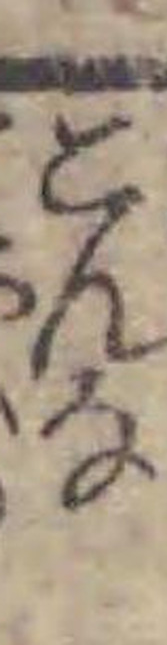こんな
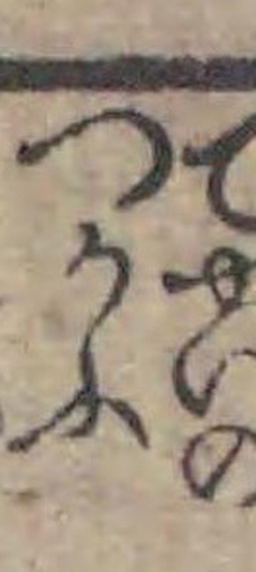つかふ
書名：新鋳小判 : 3巻
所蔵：国立国会図書館 National Diet Library, JAPAN
